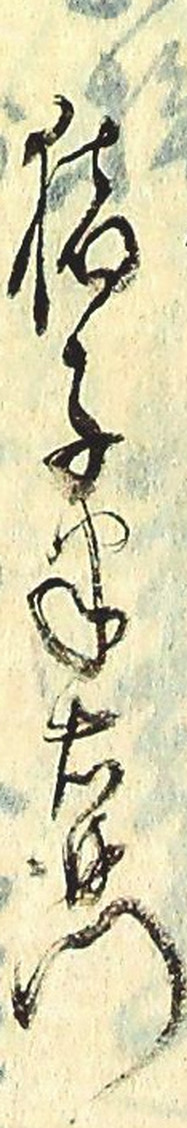猪子半右衛門
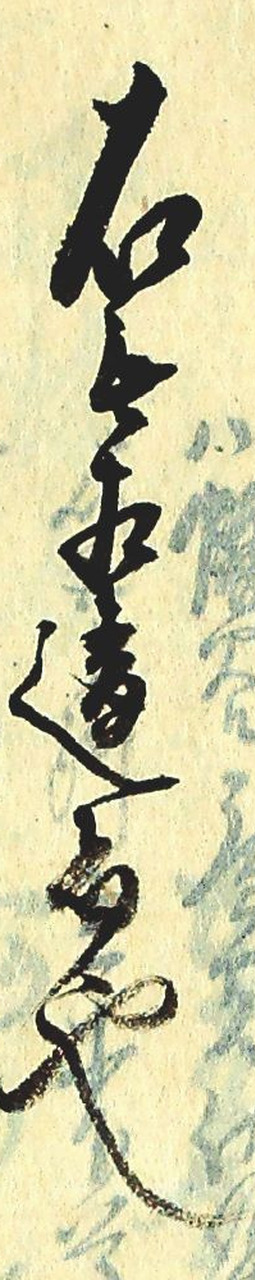右無相違者也
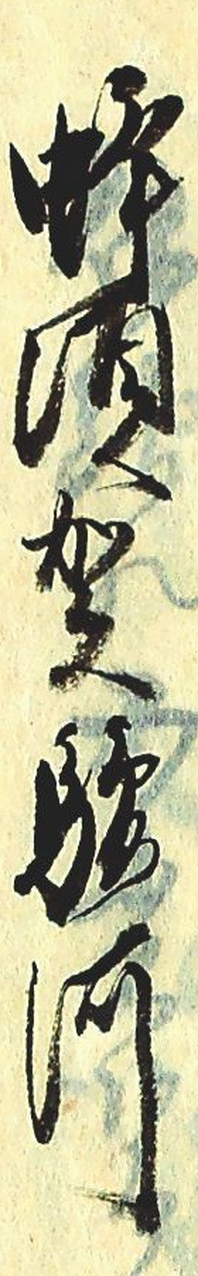蜂須賀駿河
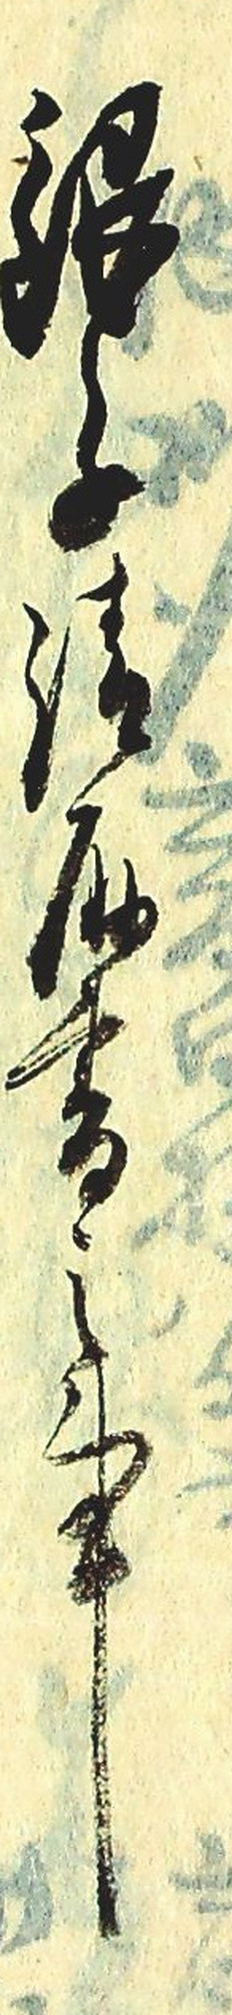銀子請届書之事
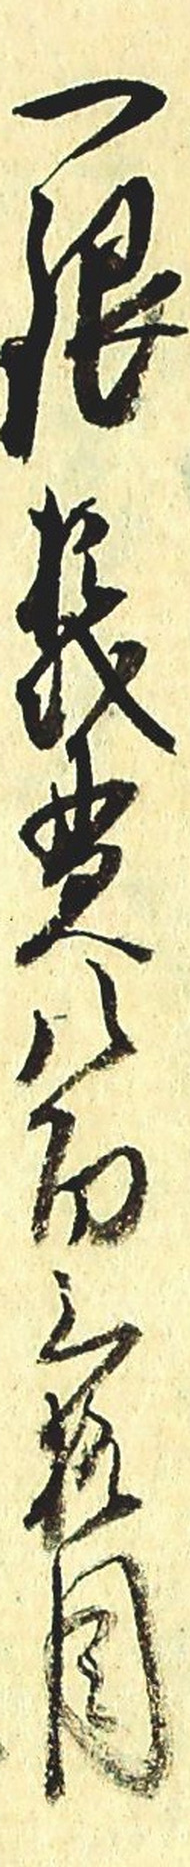一銀拾弍貫八百三拾目
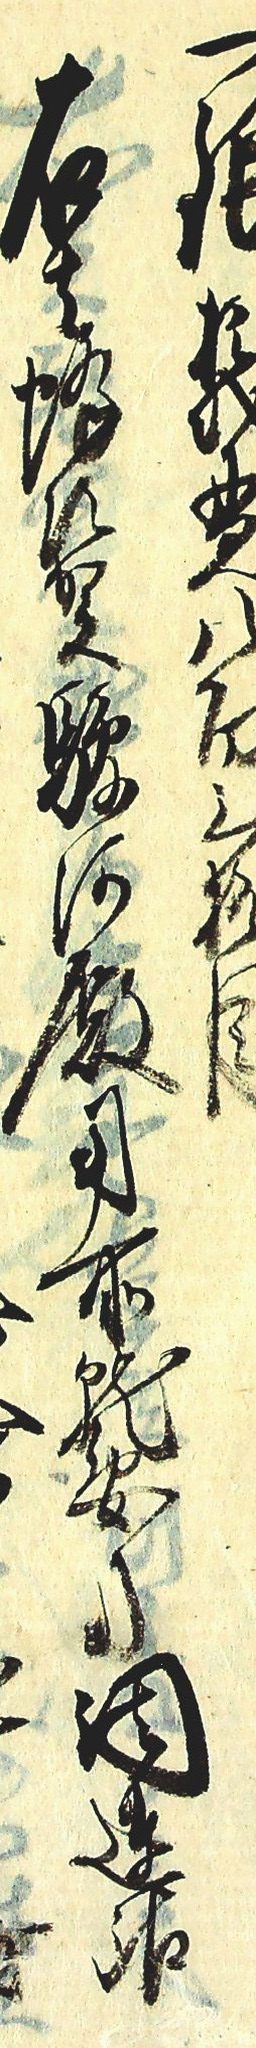右は蜂須賀駿河殿用所就安用調達銀
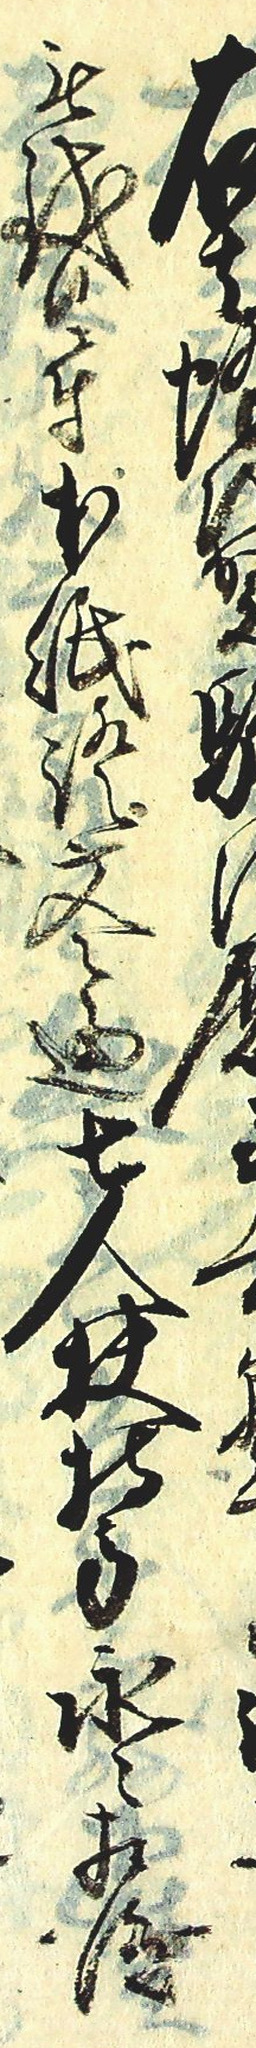無致候に付本紙証文之通七人扶持方相渡
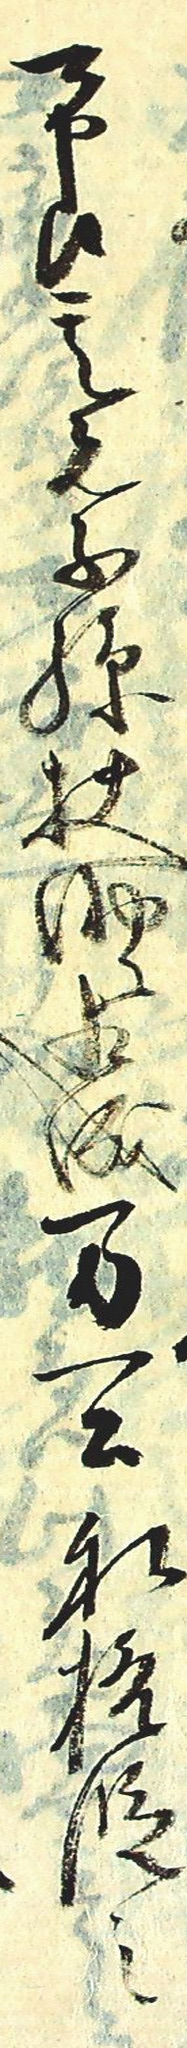可申候其元子孫扶助に相成万一公私各段之
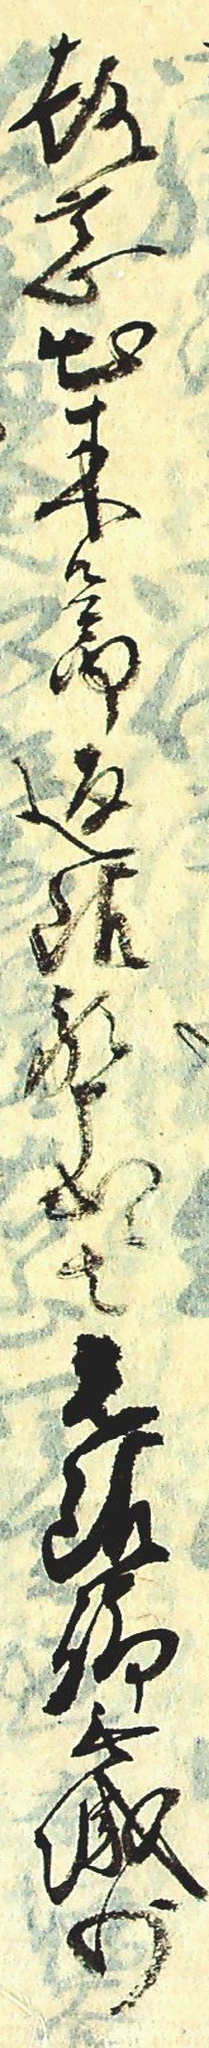趣意出来候節返銀於申出には元銀聊無減少
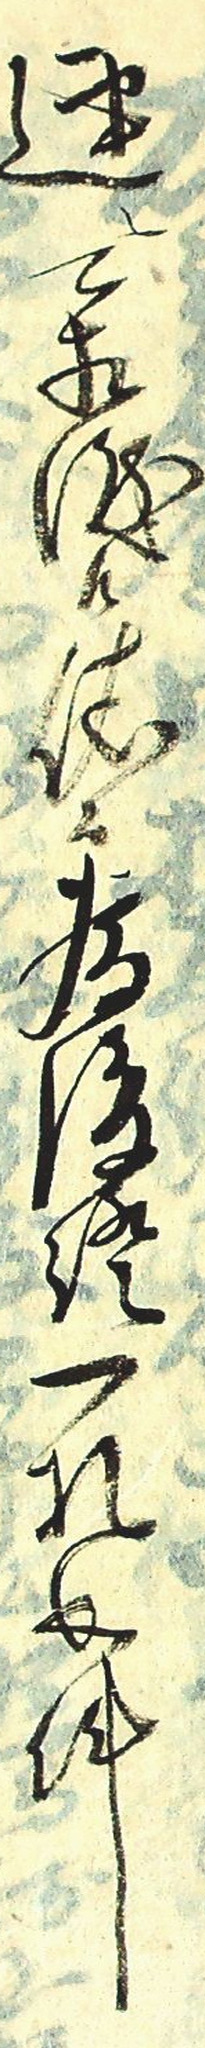速に可相渡候仍て為後証一札如件
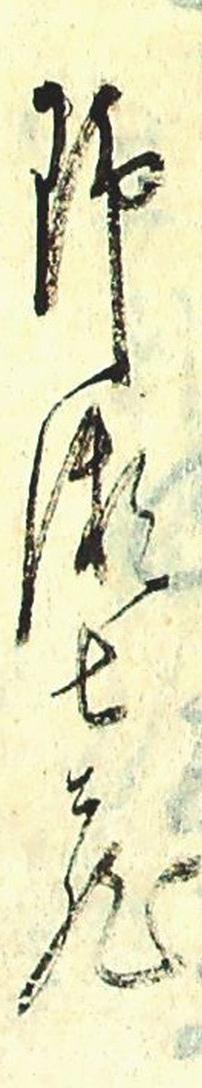野瀬七蔵

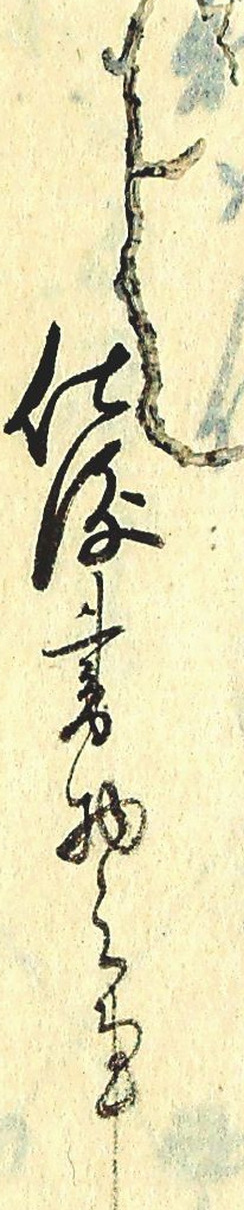仕度書物之事
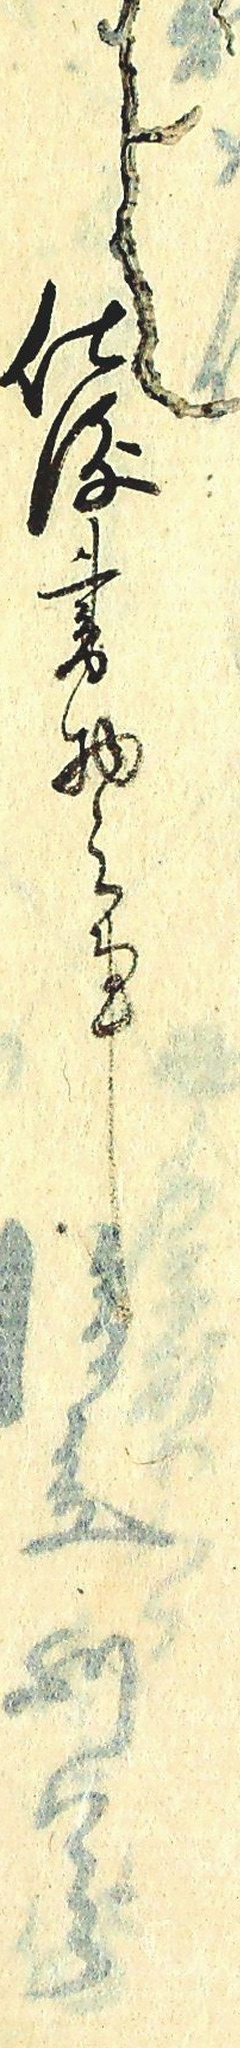仕度書物之事
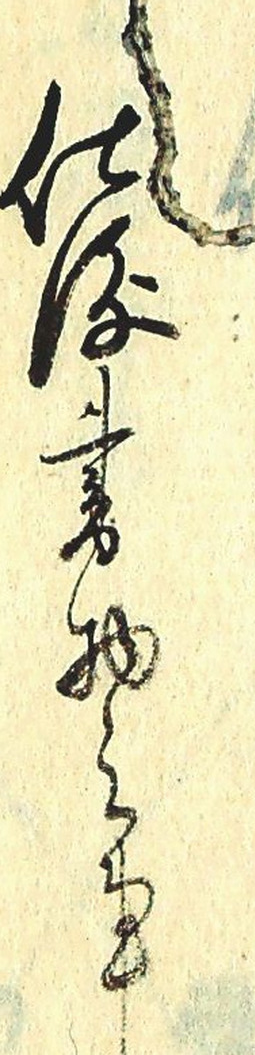仕度書物之事
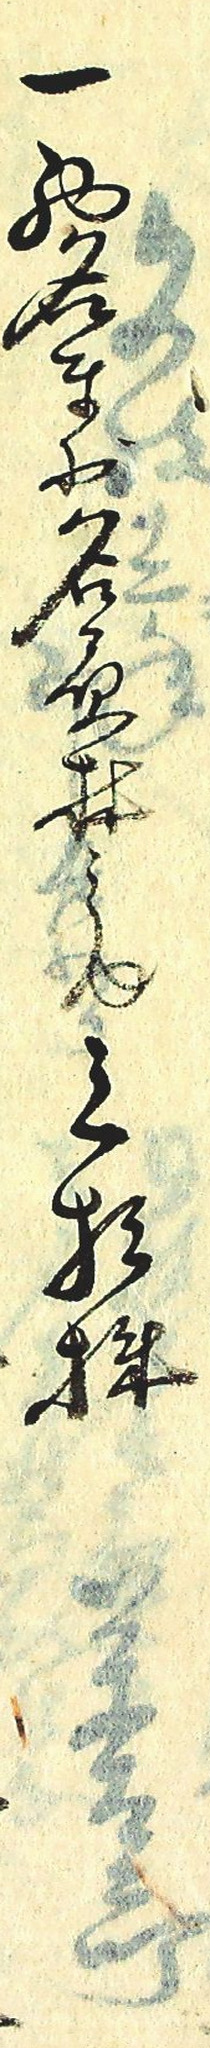一西名東村名負林之内三拾株
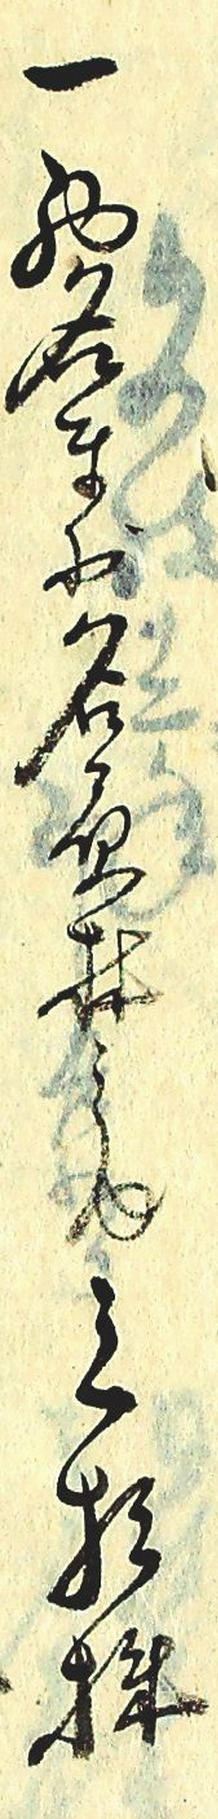一西名東村名負林之内三拾株
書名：諸御願書控(弐番）
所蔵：鳴門教育大学 Naruto University of Education
